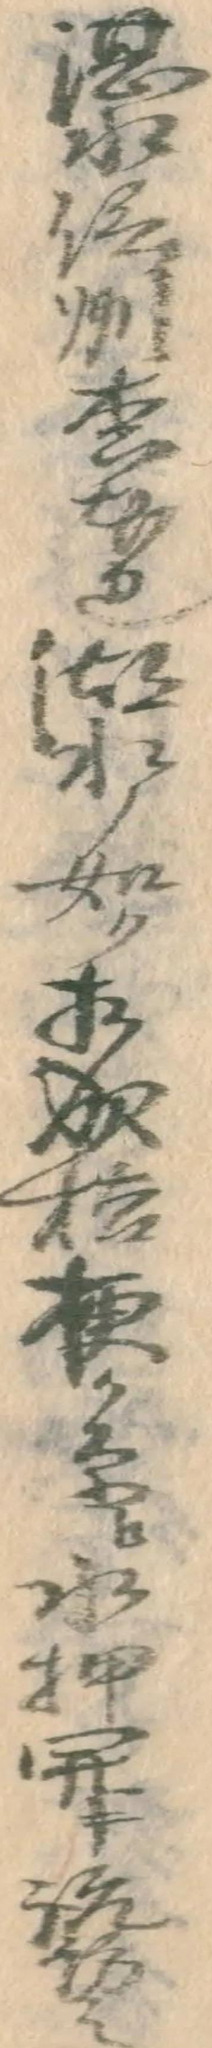湛水信州松本辺潮水ノ如ク相成桔梗ケ原江水押開キ諏訪之

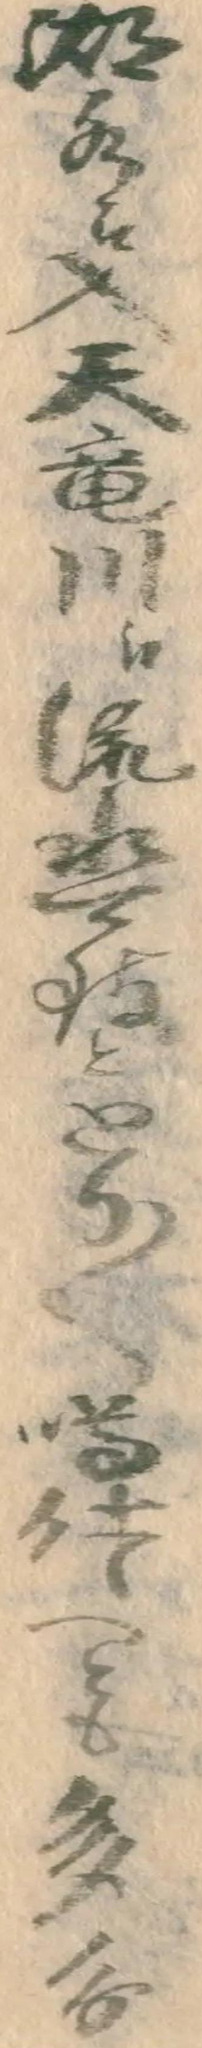潮水江入天龍川江流可致ととり〳〵噂仕候へとも多分
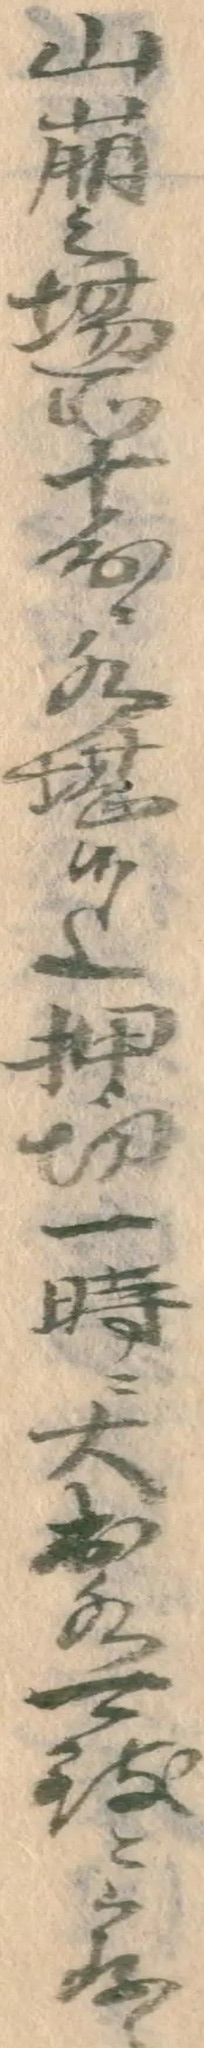山崩之場所十分ニ水湛候上押切一時二大出水可致と被存候
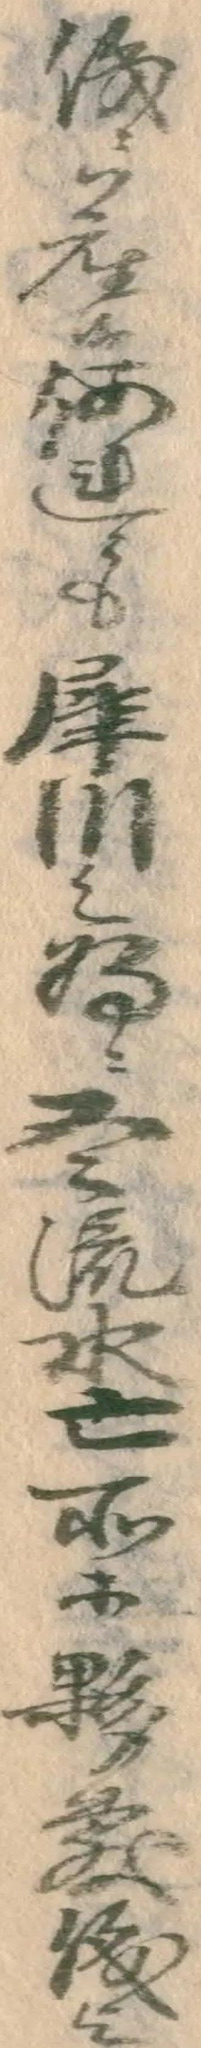儀二御座候何れ二も犀川之為ニ又々流水亡所等夥敷義と
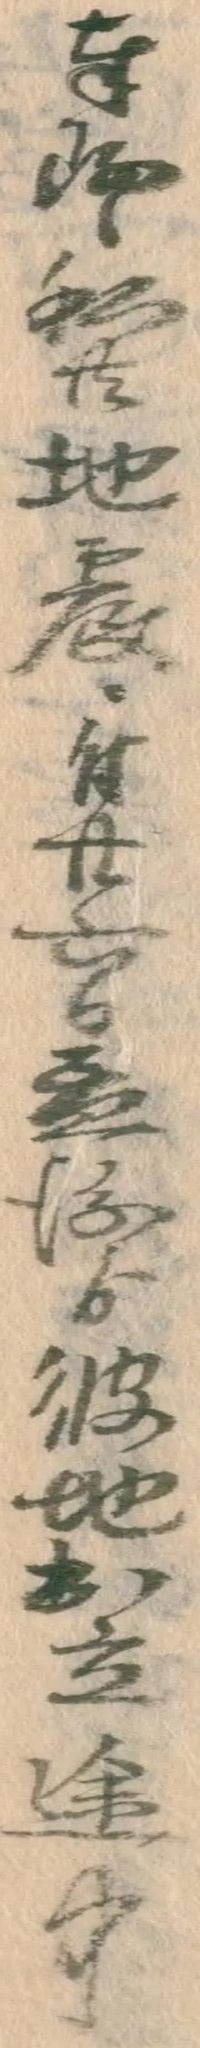奉存候私共地震二付廿六日昼後ゟ彼地出立途中
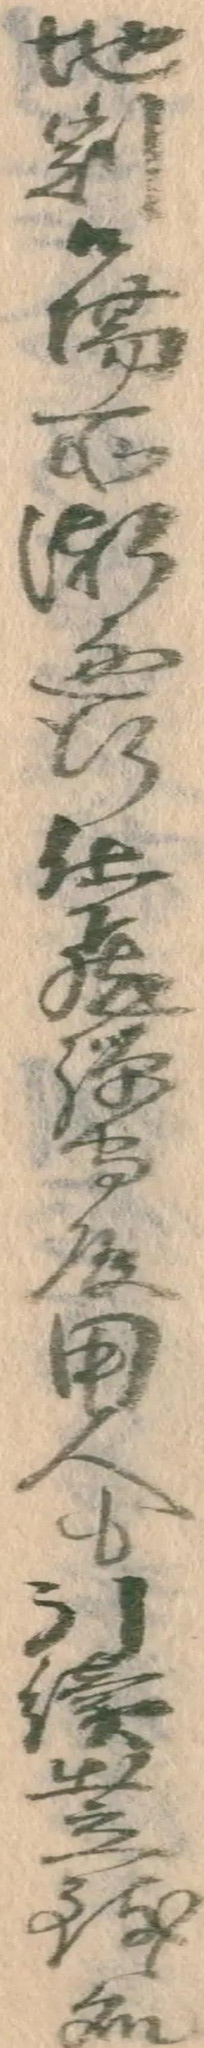地割候場所漸通行仕飛騨守殿用人も引続出立致候処
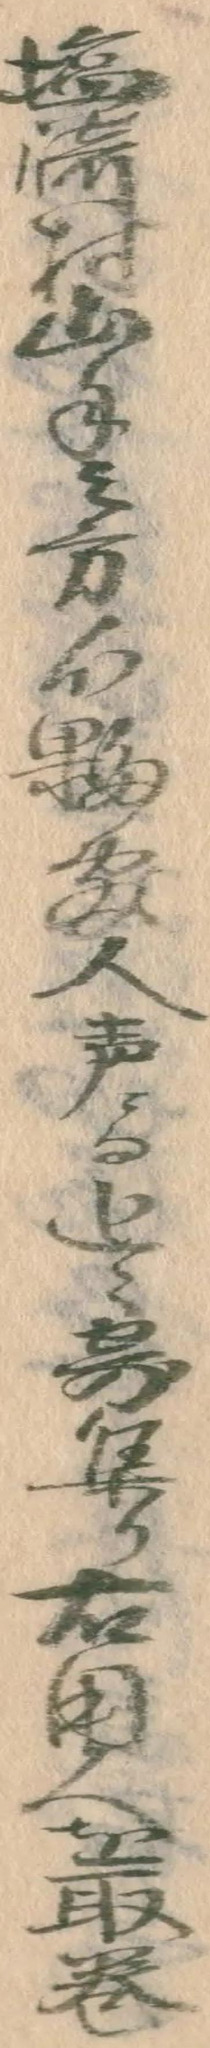塩崎村山手之方ゟ夥敷人声ニ而追々寄集り右用人を取巻
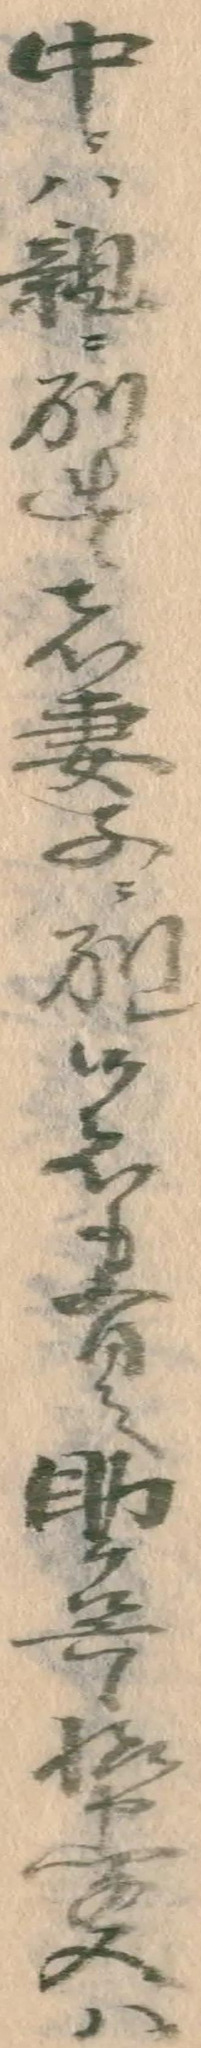中ニハ親ニ別れし者妻子ニ分レ候者も有之助ケ呉様申聞又ハ
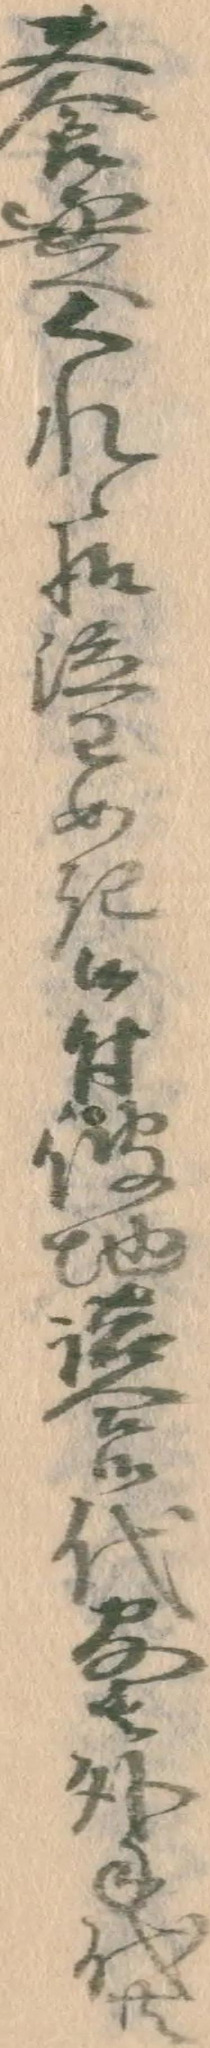夫食与へくれ候様泣わめき候付彼地詰合代官其外手代共
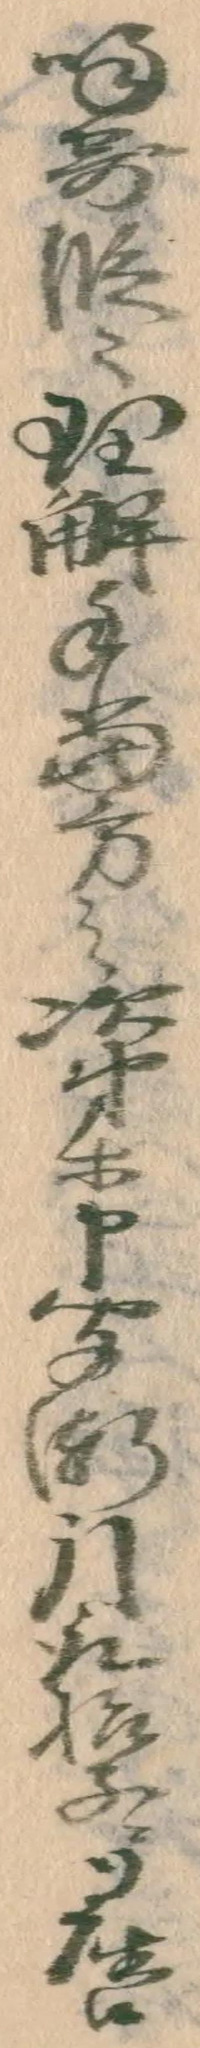呼寄段々利解手当方之次第等申聞漸引取申候様子ニ御座候
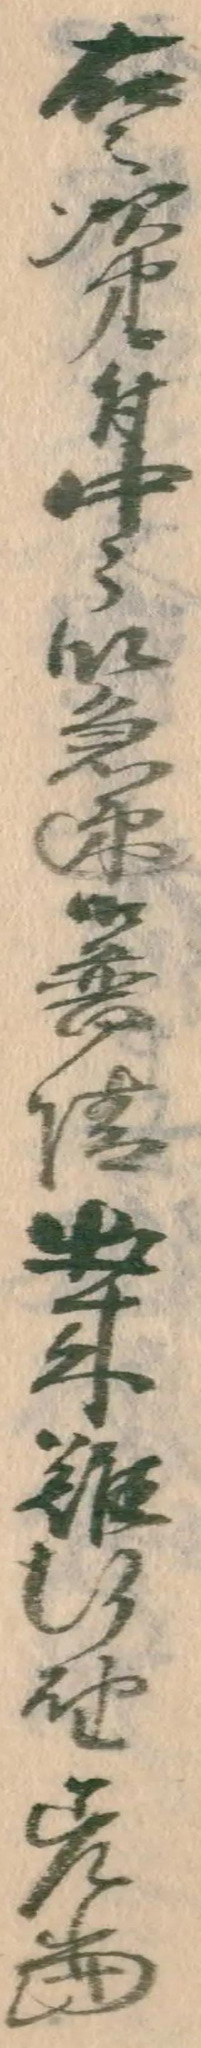右之次第二付中々以急速御普請出来難行届差当
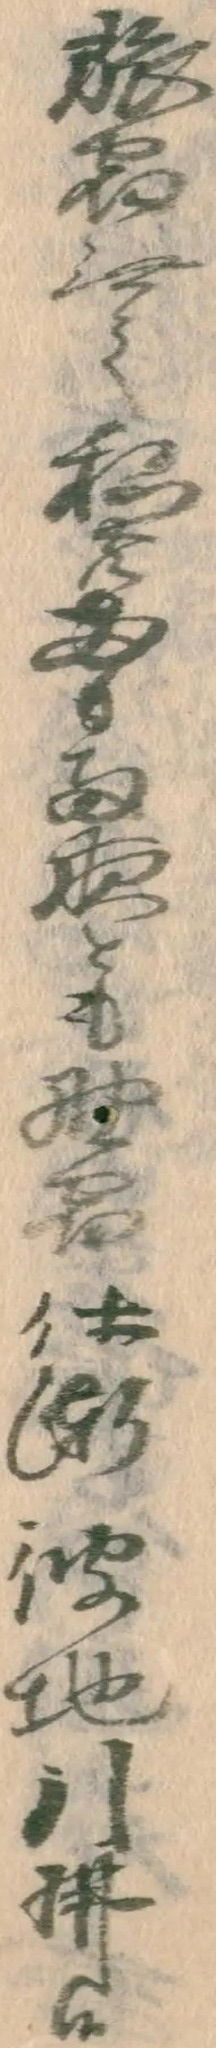旅宿無之私共両日両夜とも野宿仕漸彼地引払候
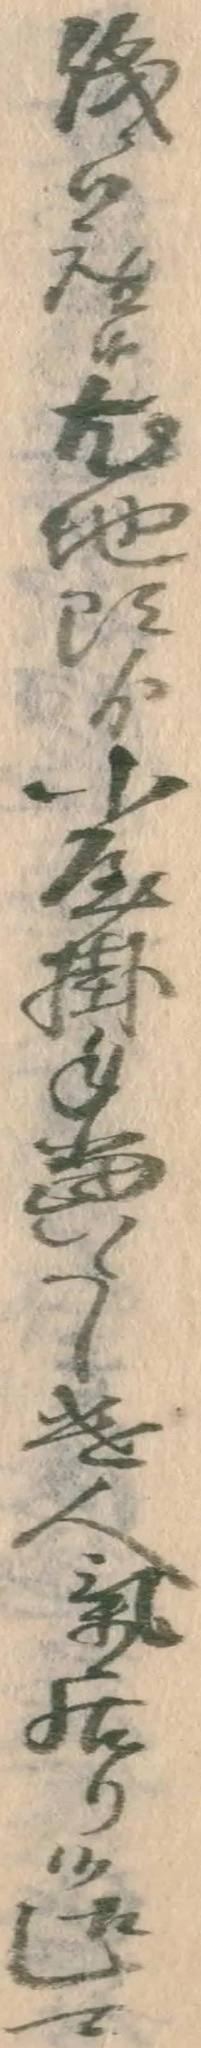儀二御座候尤地頭ゟ小屋掛手当いたし遣人気居り候趣可
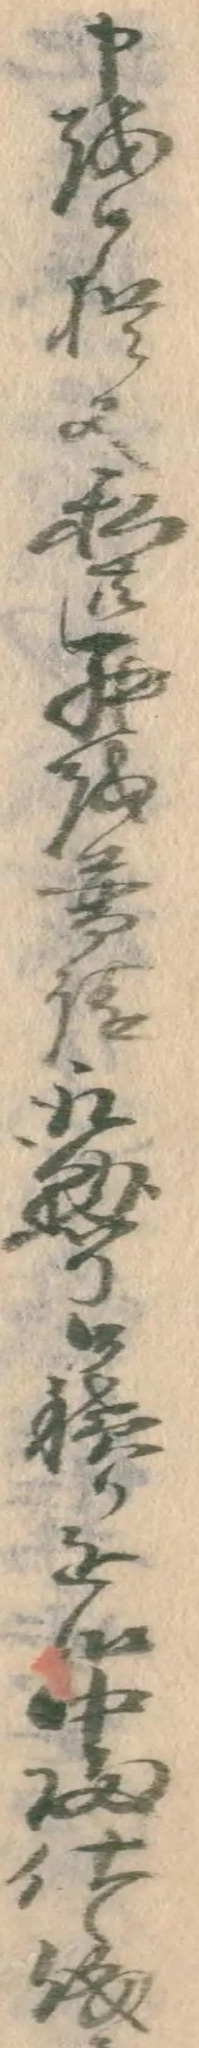申残候様二又私共罷越普請取懸り候積ヲ以中帰仕候儀ニ
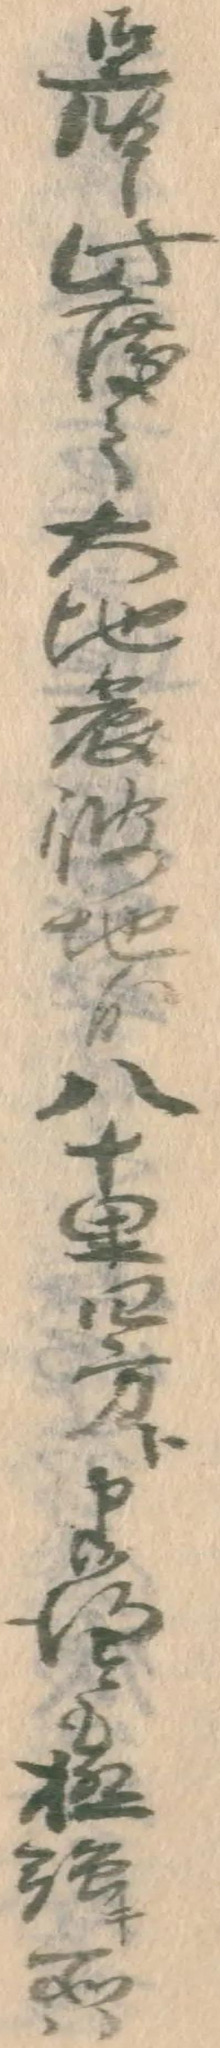御座候此度之大地震彼地ゟハ十里四方と申居候得とも極強キ所ハ
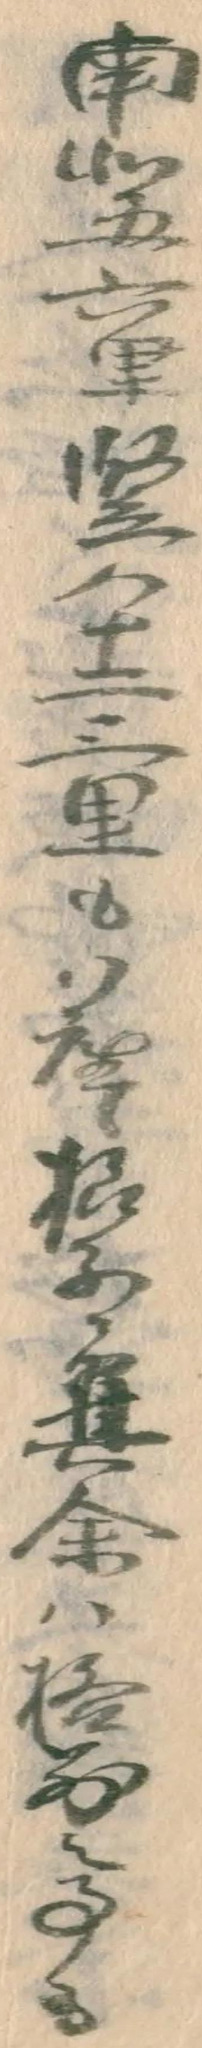南北五六里竪ハ十二三里も御座候様子其余ハ格別之事も
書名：信州大地震之記
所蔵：国立国会図書館 National Diet Library, JAPAN
